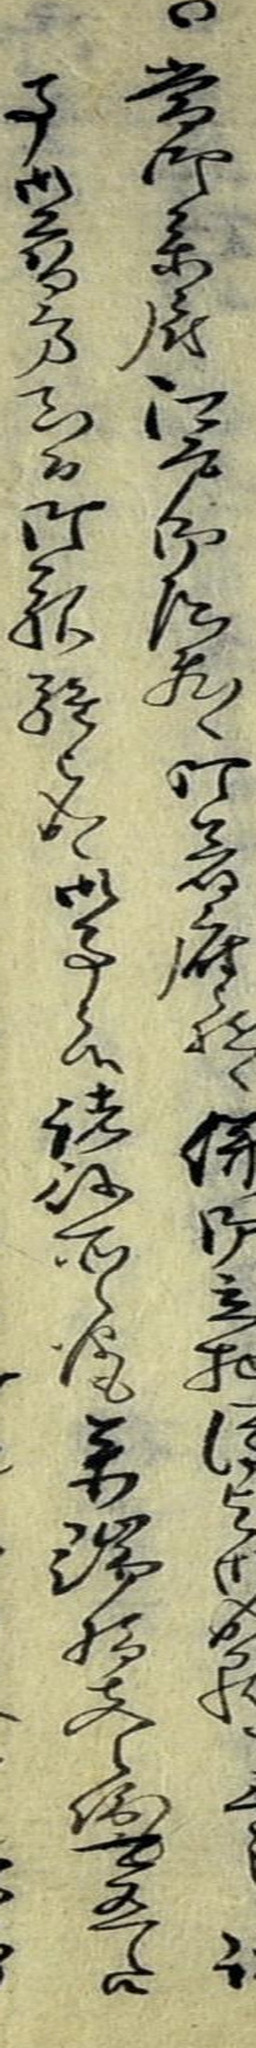事御暮方至而御艱難被成候御事に候諸役所之儀も万端指支之儀可有之候
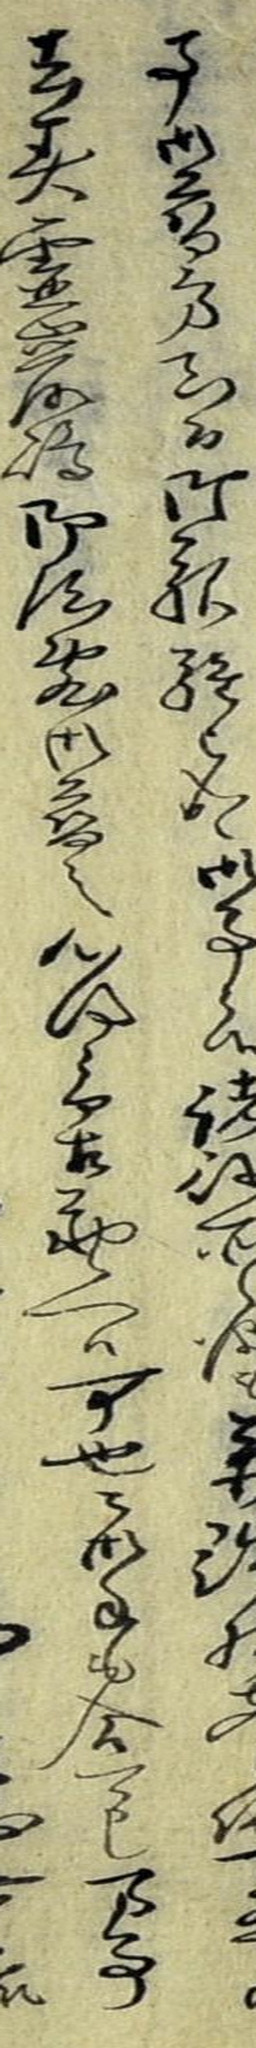去春霊厳嶋御屋敷御暮之心得に而相勤候へは可也に御手も合可申候万事
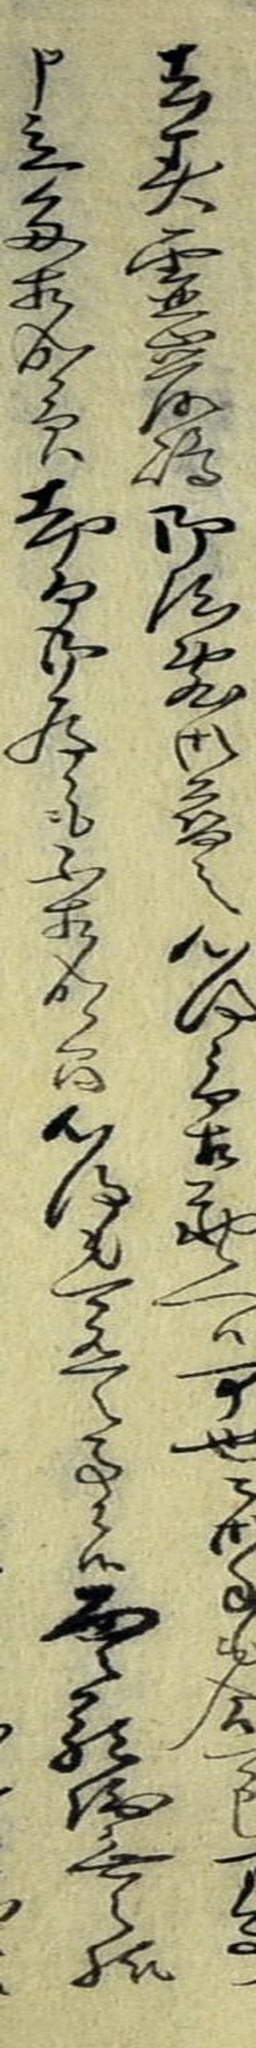申立多相成候而は却而御為にも不相成候間心得も可有之事に候面々難儀無之様
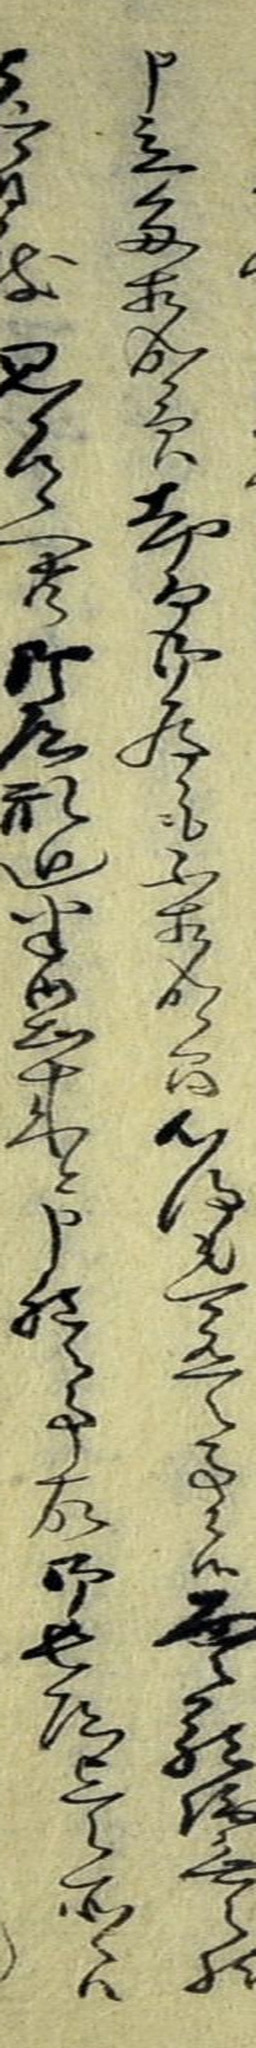被仰付度思召候へ共御屋形廻半御出来と申程之事故御長屋迄之所へは
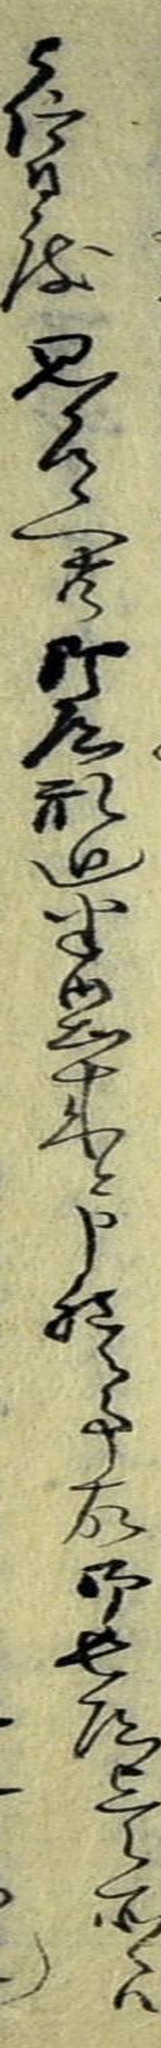被仰付度思召候へ共御屋形廻半御出来と申程之事故御長屋迄之所へは
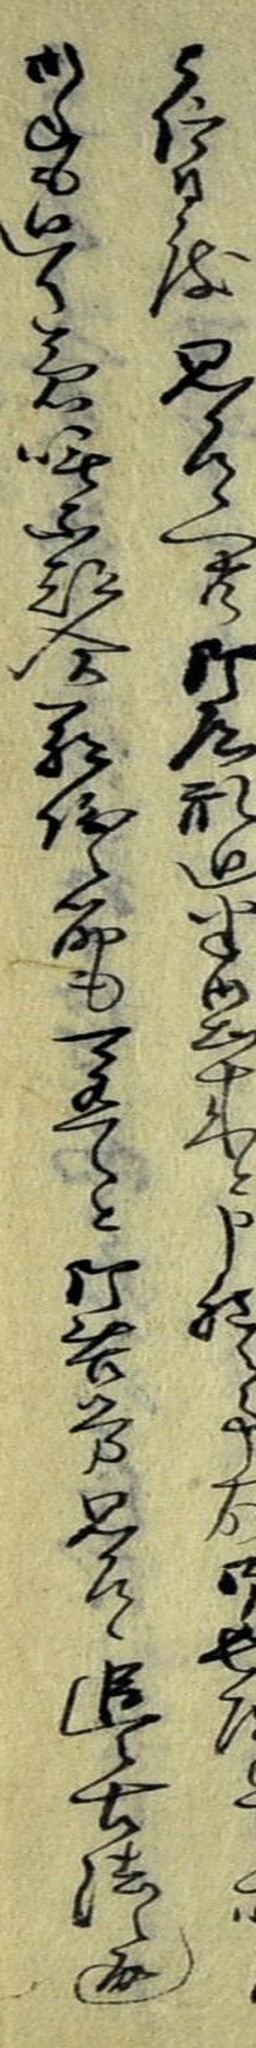御手も廻り兼嘸不都合難儀之筋も可有之と御苦労思召候追々古法之通

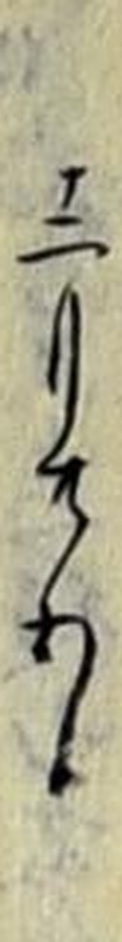十二月廿五日
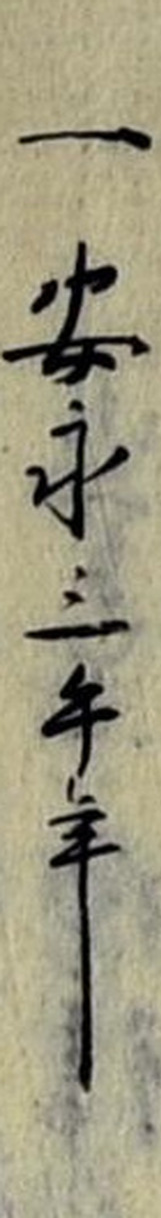一安永三午年
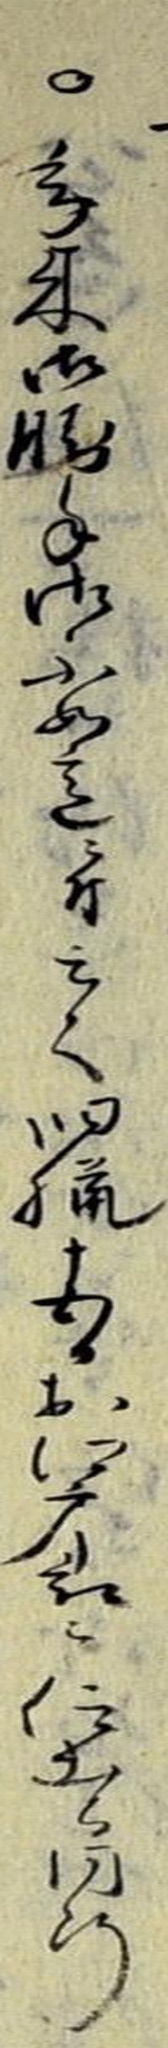〇年来御勝手御不如意に付云々旧臘十五日於江戸表被仰出与同断
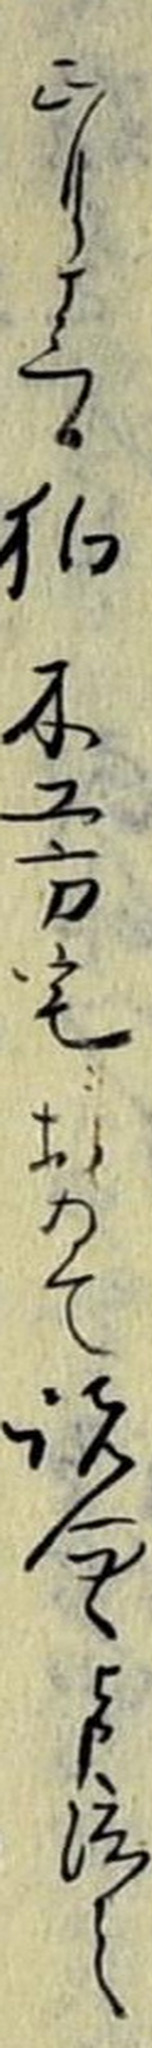正月十三日狛杢方宅におゐて諸向へ被申渡之
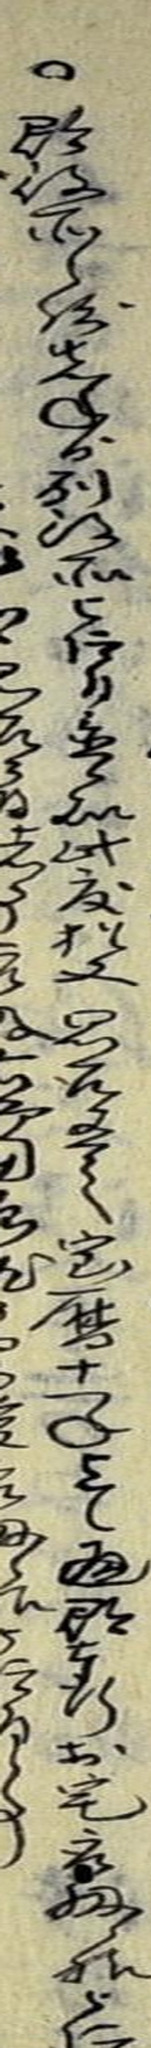〇郡役所之儀先年ゟ別役所被仰付置候処此度猶又思召有之宝暦十一年迄之通郡奉行於宅取扱候様被仰付御預所
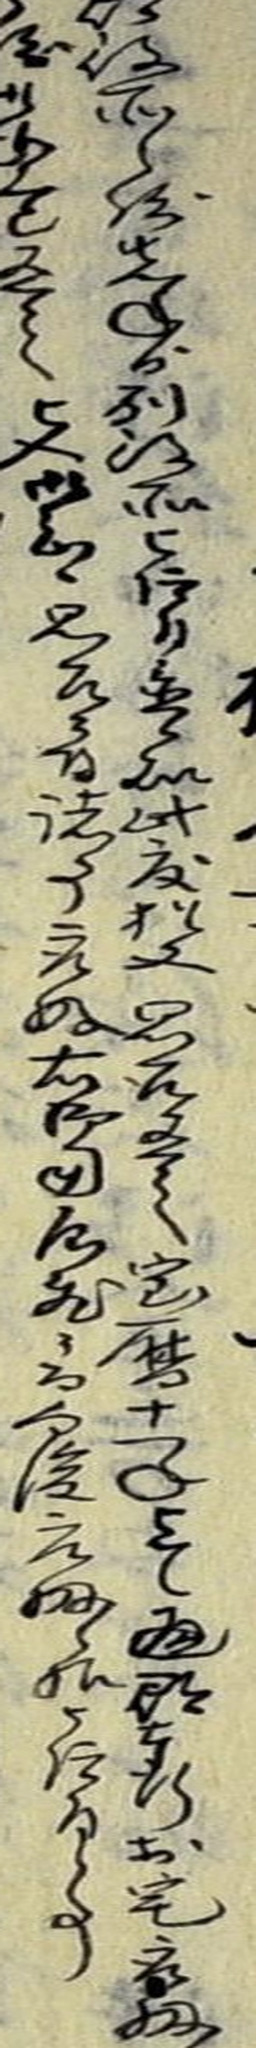之儀御趣意有之被入御念候思召に付諸事取扱右御用屋敷に而向後取扱候様被仰付候事
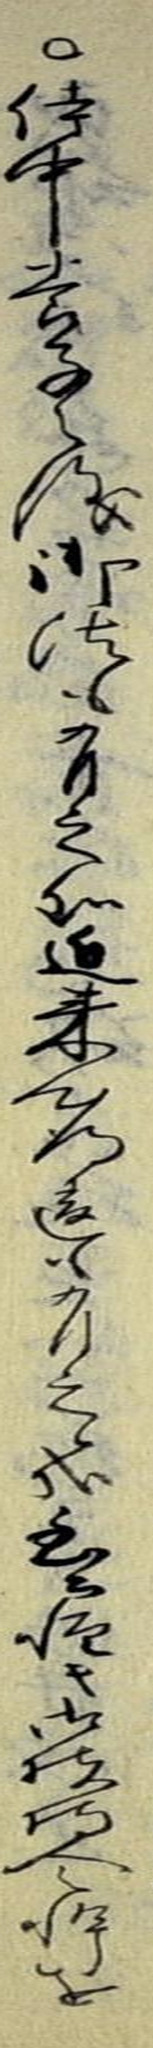〇侍中養子之儀御法も有之処近来心得違も有之候哉至而軽き御扶持人之悴を
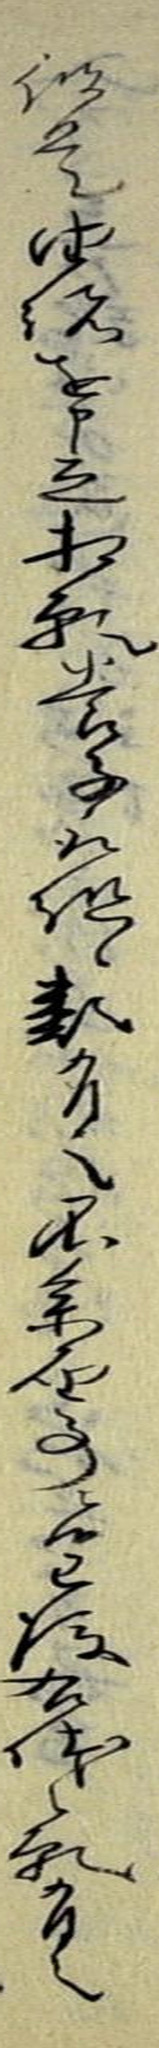彼是由緒を申立相願養子取組候類有之不参届事に候已後有体之願有之
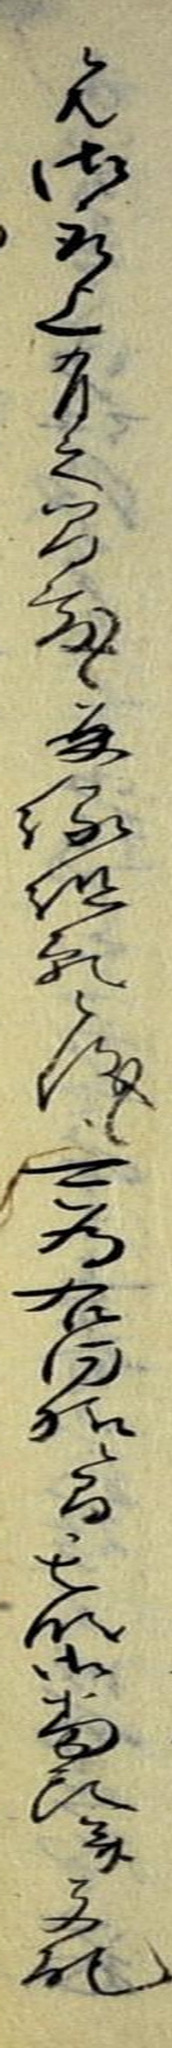候共御取上有之間敷候再縁組願之儀も可為右同様候間其段御番頭并支配
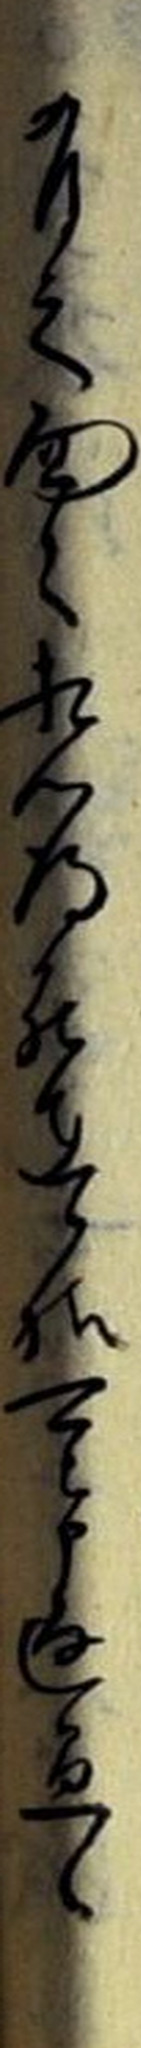有之面々相心得罷在候様可被申通置候
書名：命令之部 二
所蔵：福井県文書館 Fukui Prefectural Archives
